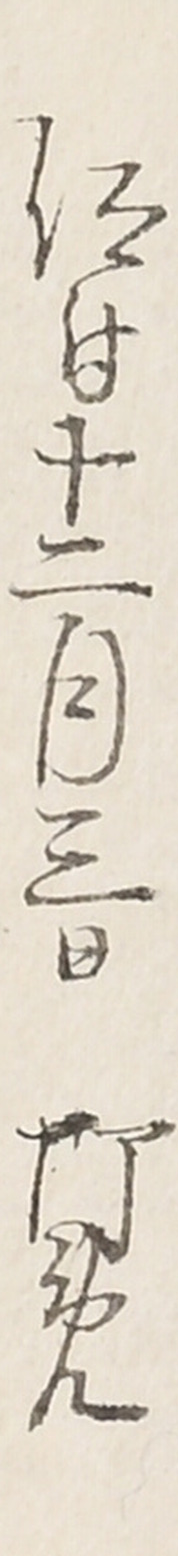仰付十二月三日御免
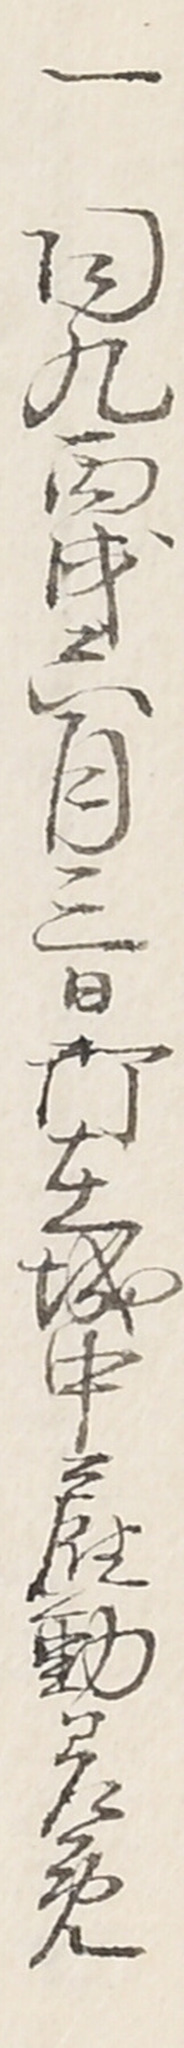一同九丙戌六月三日御在城中雇勤差免
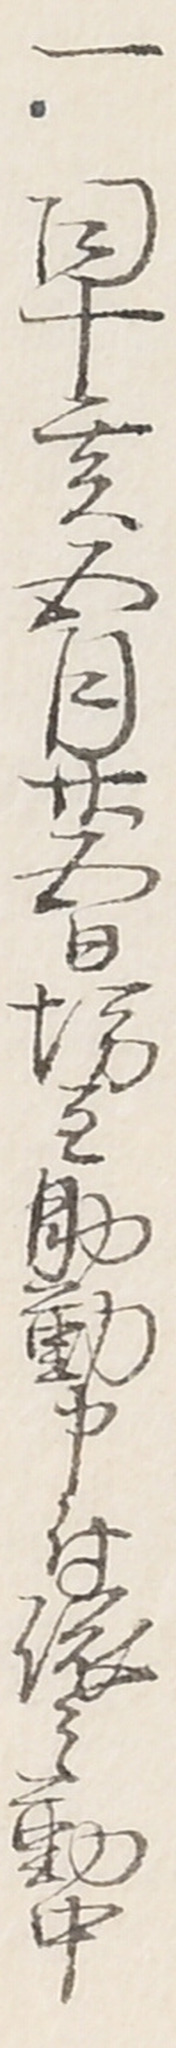一同十亥五月廿五日坊主助勤申付依之勤中
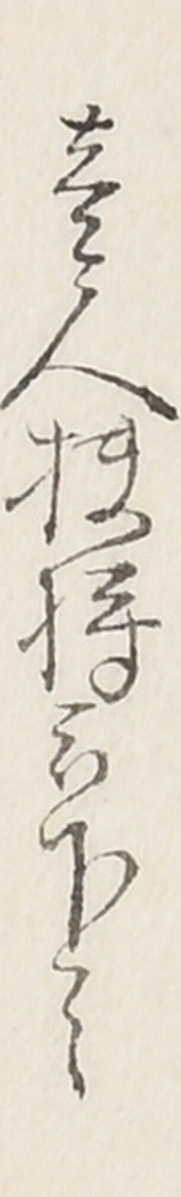壱人扶持被下之
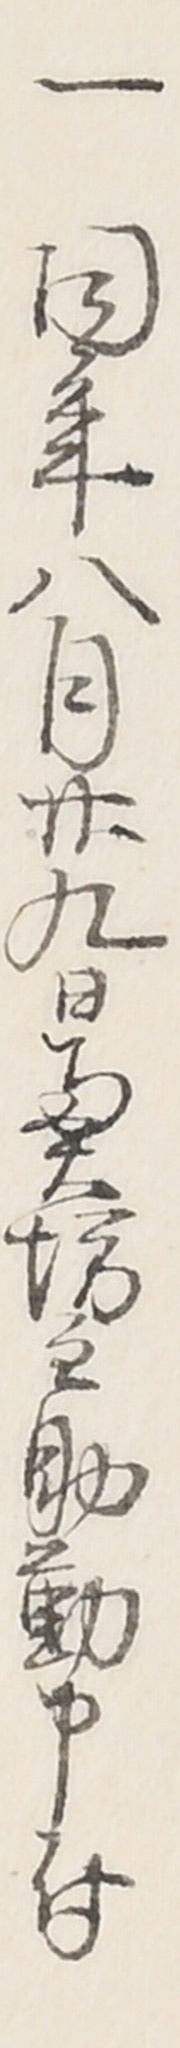一同年八月廿九日奥坊主助勤申付
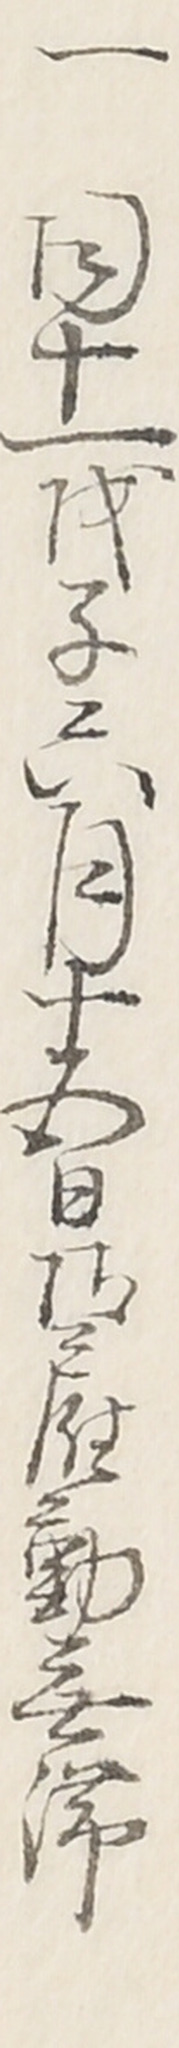一同十一戊子六月十五日御雇勤無滞
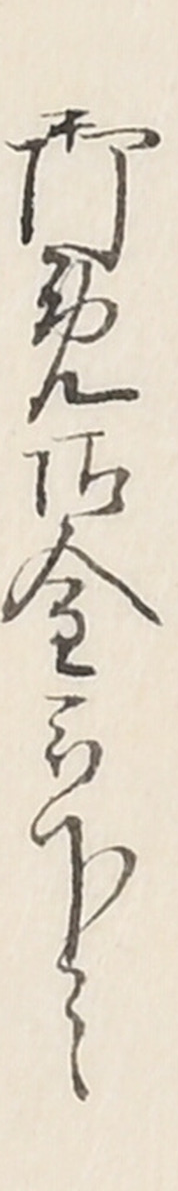御免御金被下之
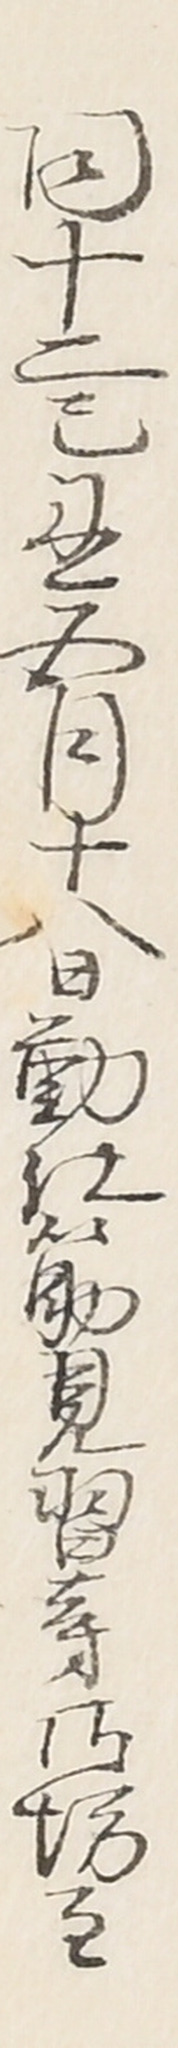一同十二己丑五月十八日勤仕筋見習旁御坊主
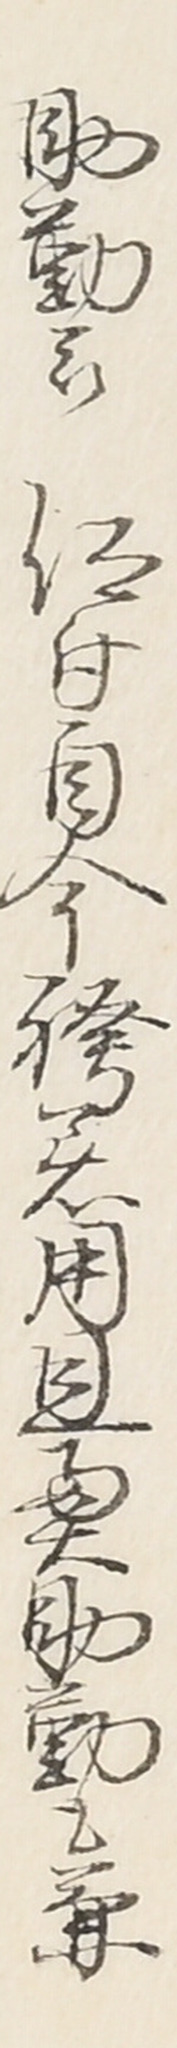助勤被仰付自今袴着用且奥助勤も兼
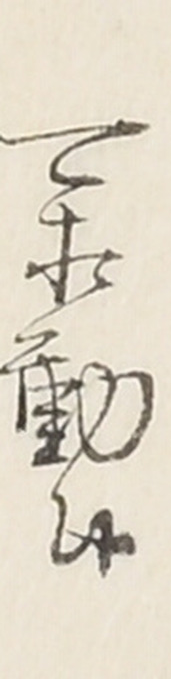可相勤候
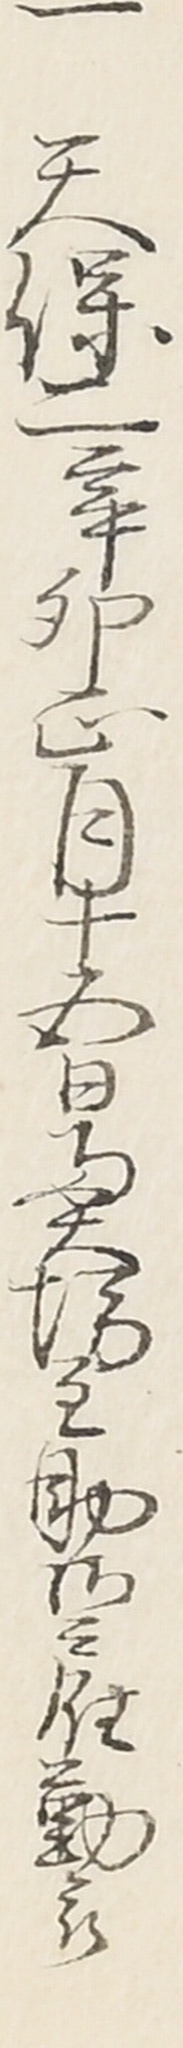一天保二辛卯正月十五日奥坊主助御雇勤被
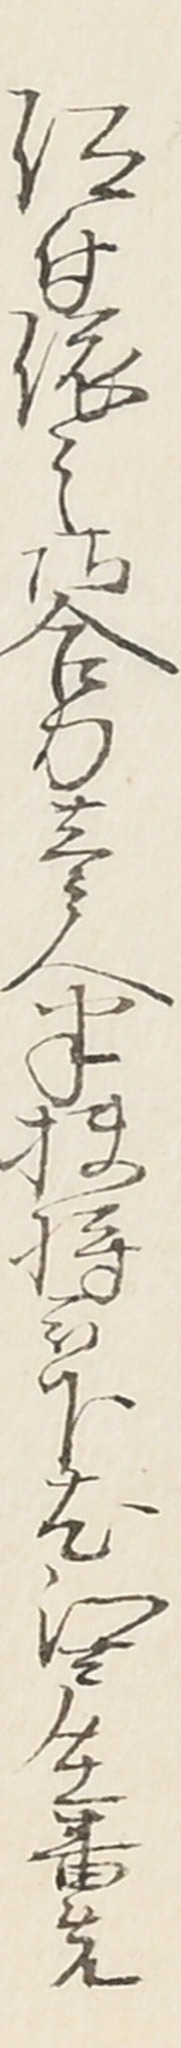仰付依之御合力壱人半扶持被下尤江戸在番先
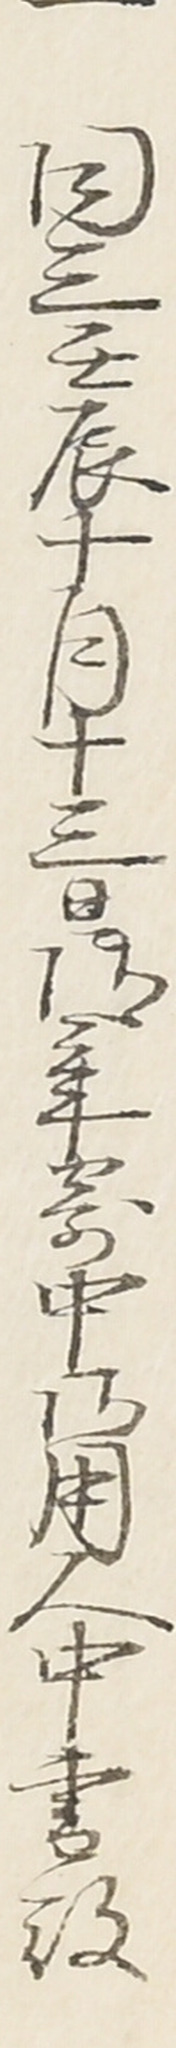一同三壬辰十月十三日御年寄中御用人中書役
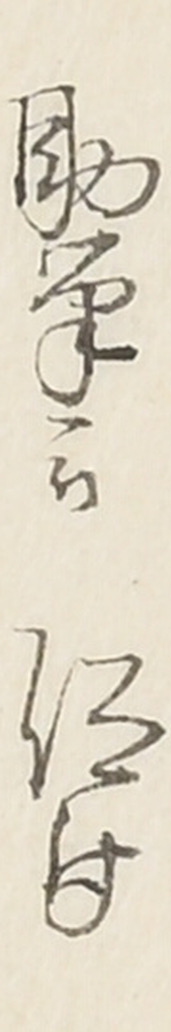助筆被仰付
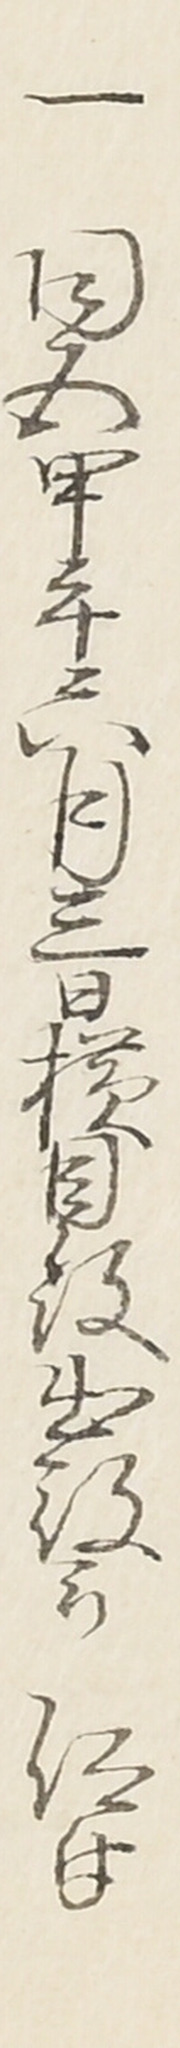一同五甲午六月三日横目役出役被仰付
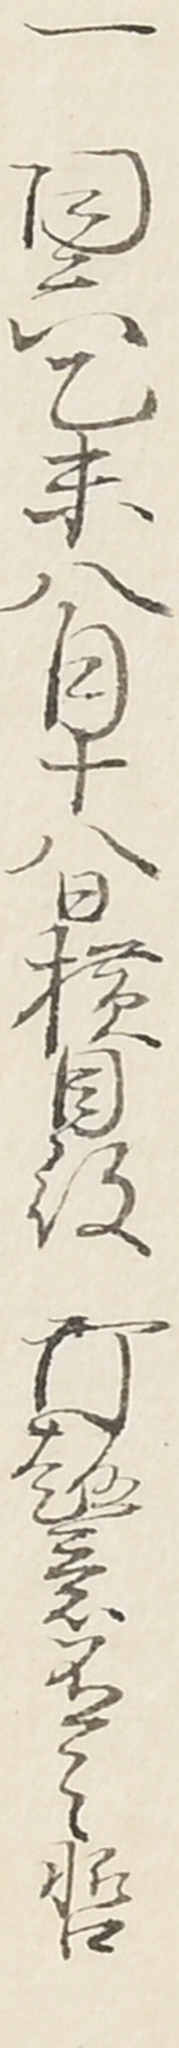一同六乙未八月十八日横目役御趣意有之暫
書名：無足諸士勤仕録（四）
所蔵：伊那市立高遠町図書館・合同会社AMANE
